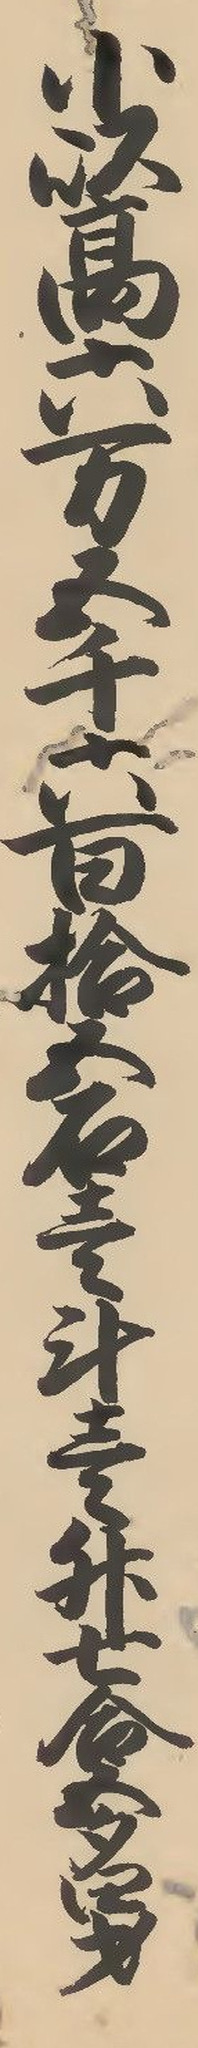小以高六万五千六百拾五石壱斗壱升七合五勺四才
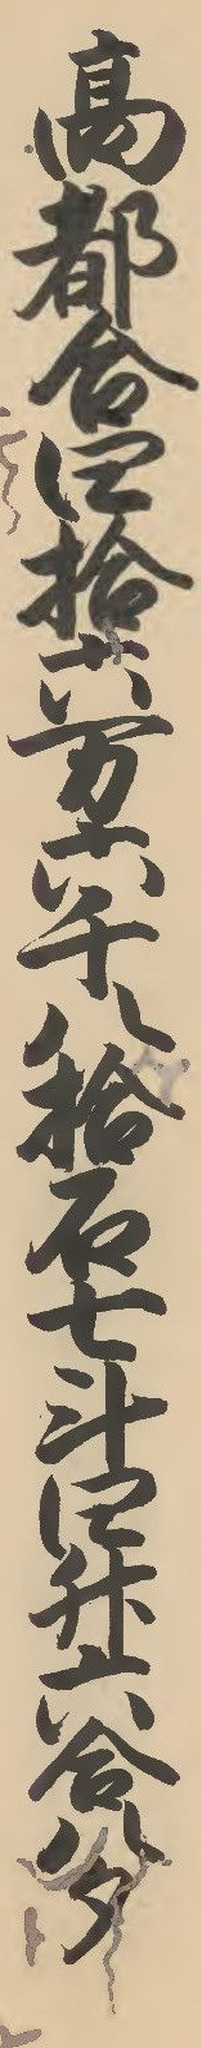高都合四拾六万六千八拾石七斗四升六合八勺
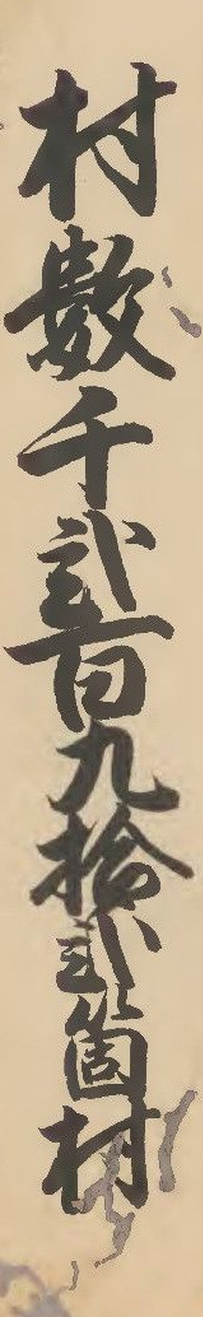村数千弐百九拾弐箇村

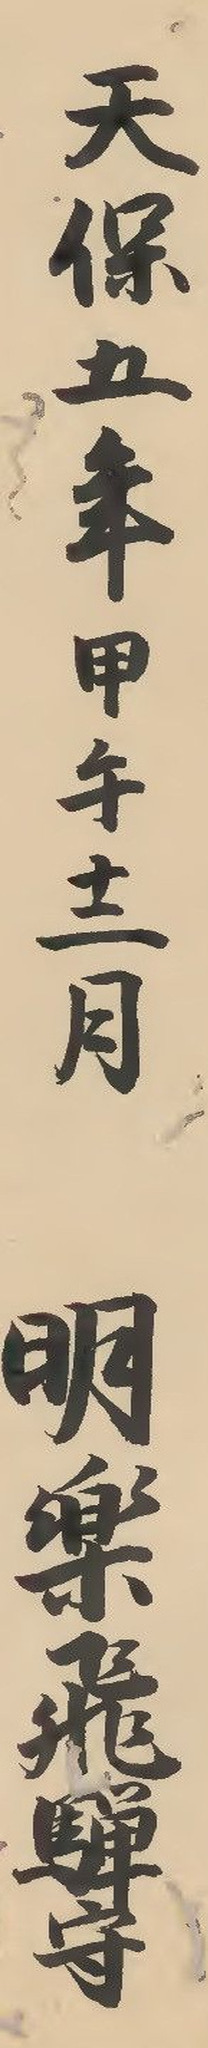天保五年甲午十二月明楽飛騨守
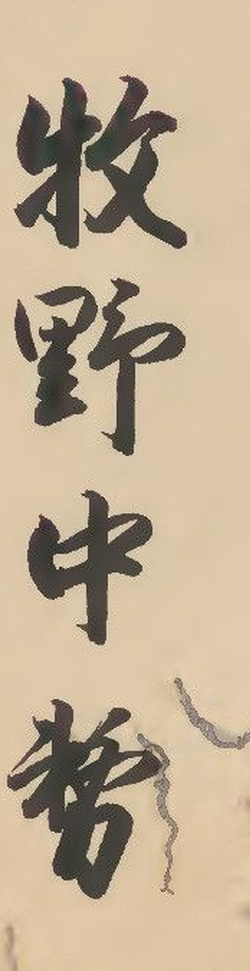牧野中務
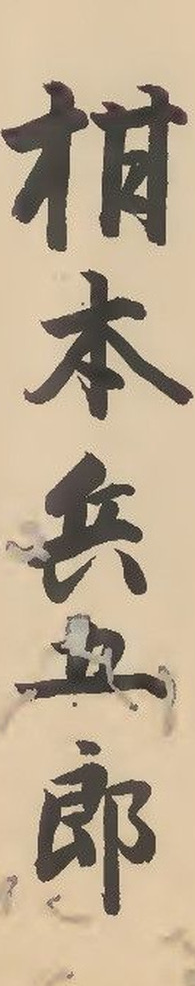柑本兵五郎
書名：三河国郷帳
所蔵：国立公文書館 National Archives of Japan
